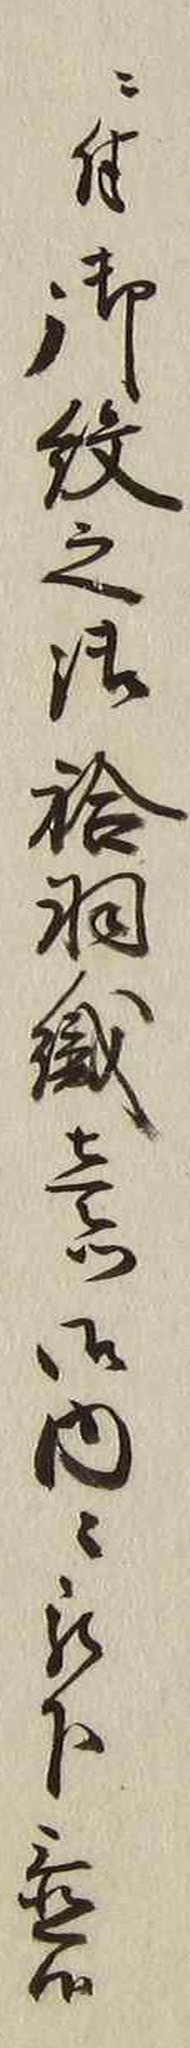ニ付御紋之御袷羽織壱ツ御内々被下置候
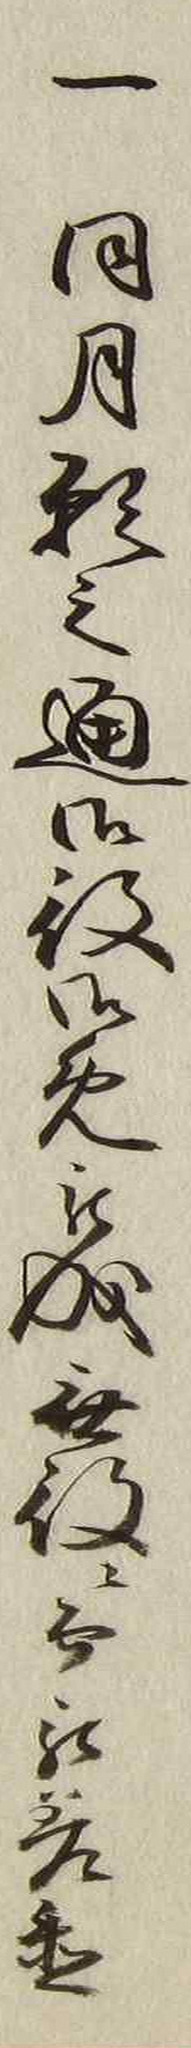一同月願之通御役御免被成無役ニ而被差置
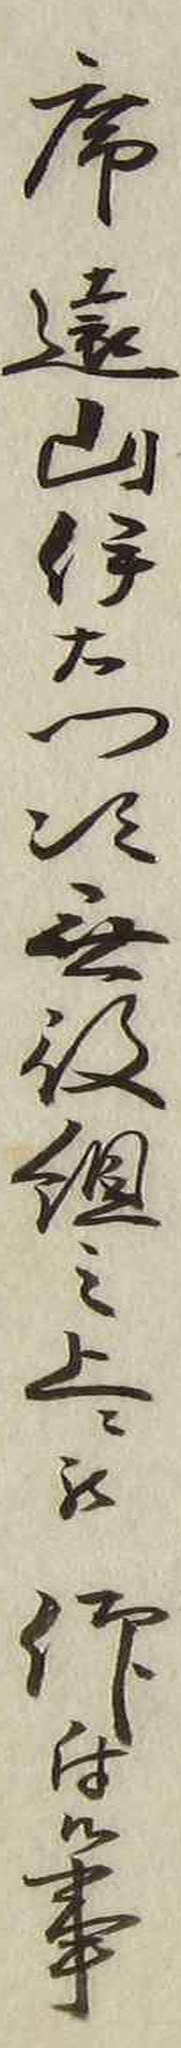席遠山伊右門次無役組之上ニ被仰付候事
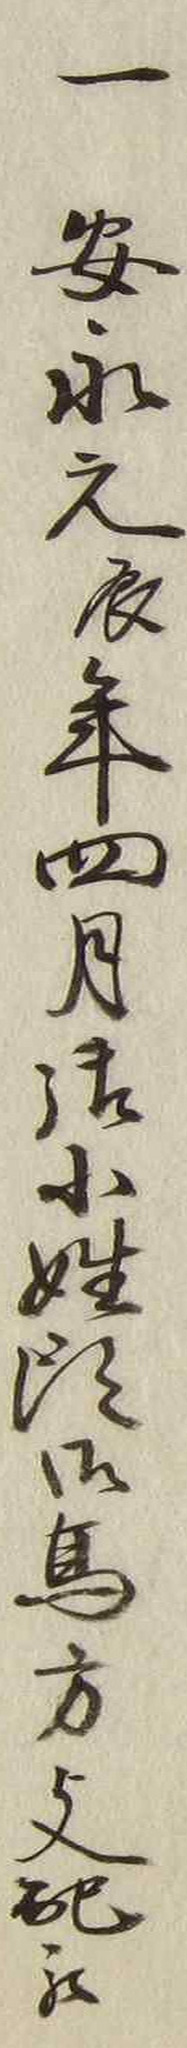一安永元辰年四月御小姓頭御馬方支配被

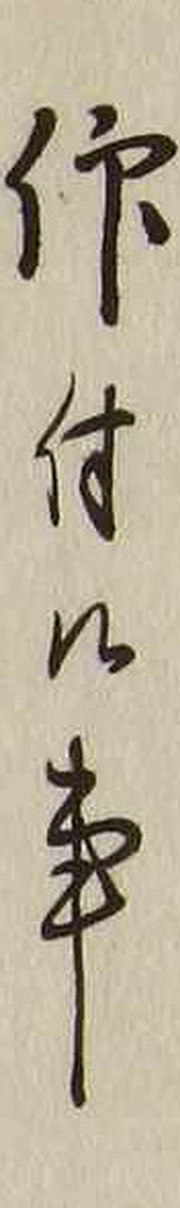仰付候事
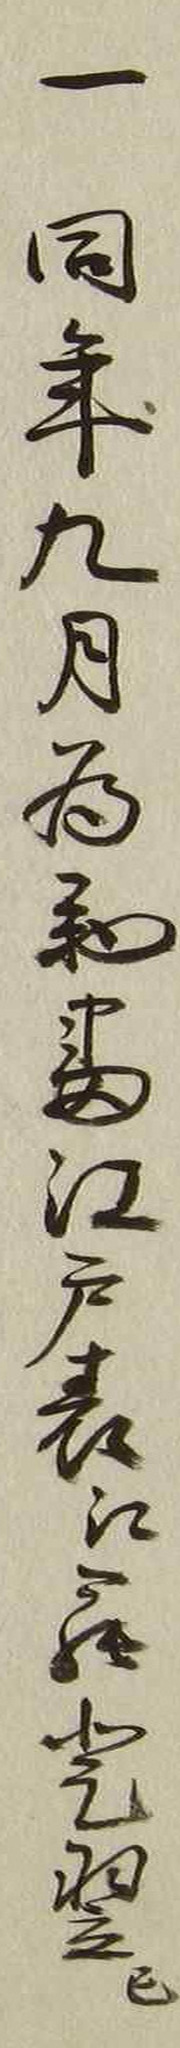一同年九月為勤番江戸表江罷登翌巳
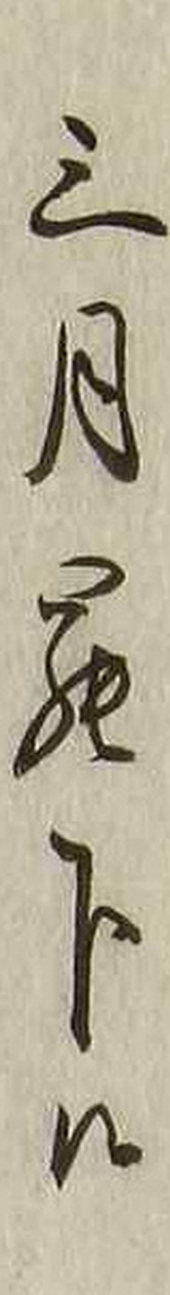三月罷下候
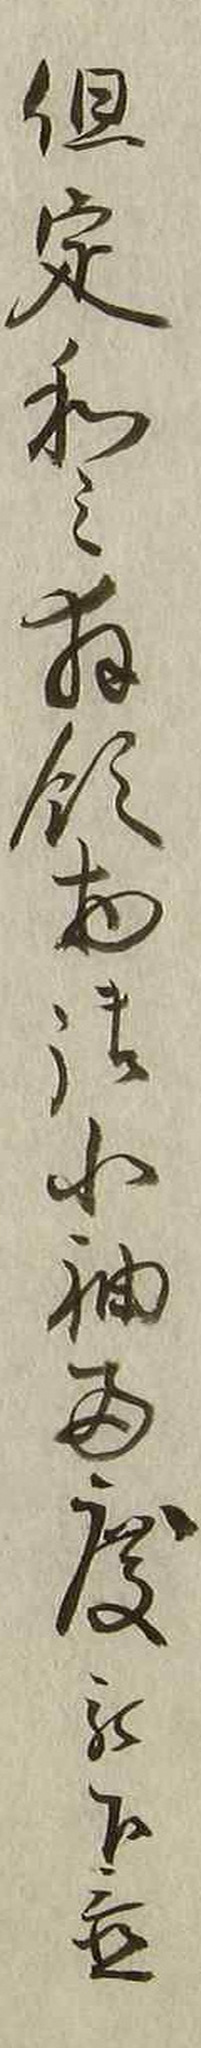但定和之拝領物御小袖両度被下置
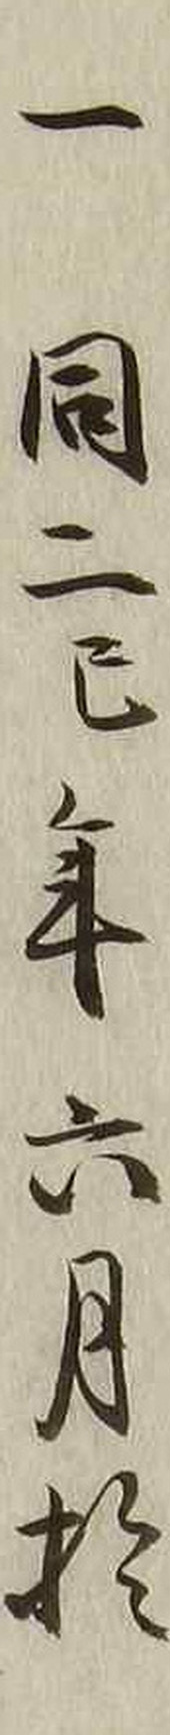一同二巳年六月於
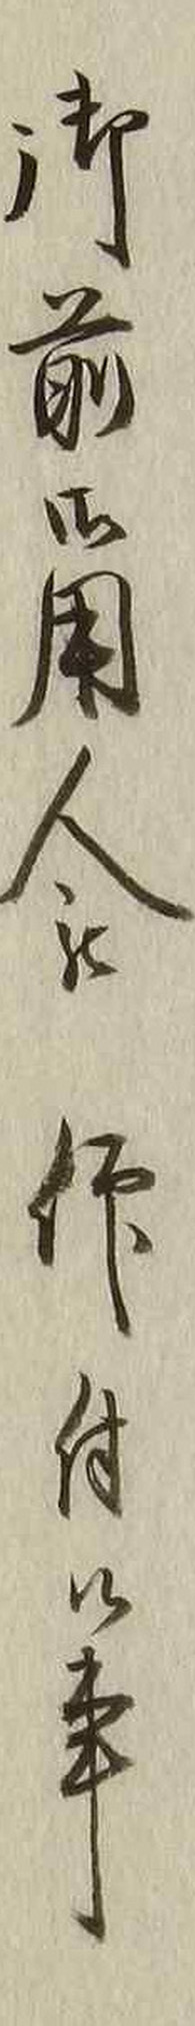御前御用人被仰付候事
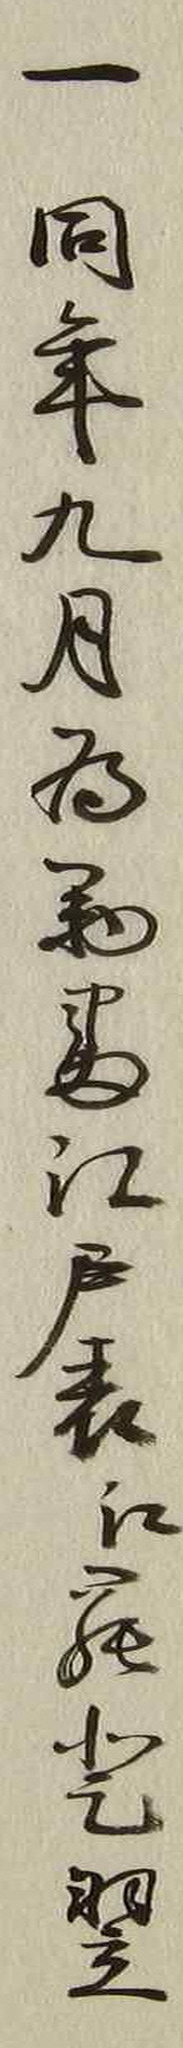一同年九月為勤番江戸表江罷登翌
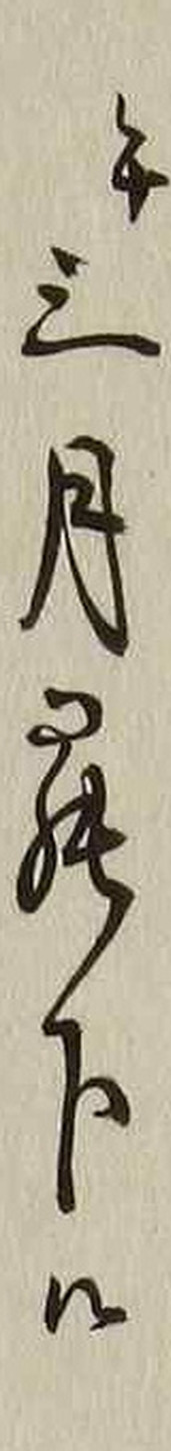午三月罷下候
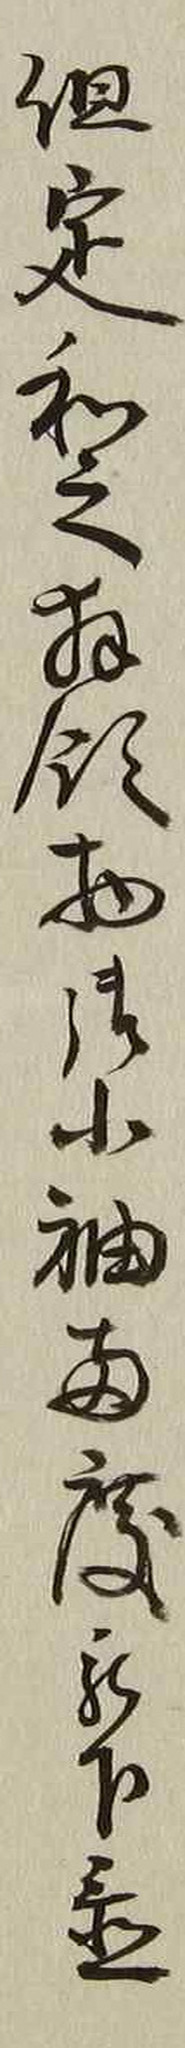但定和之拝領物御小袖両度被下置
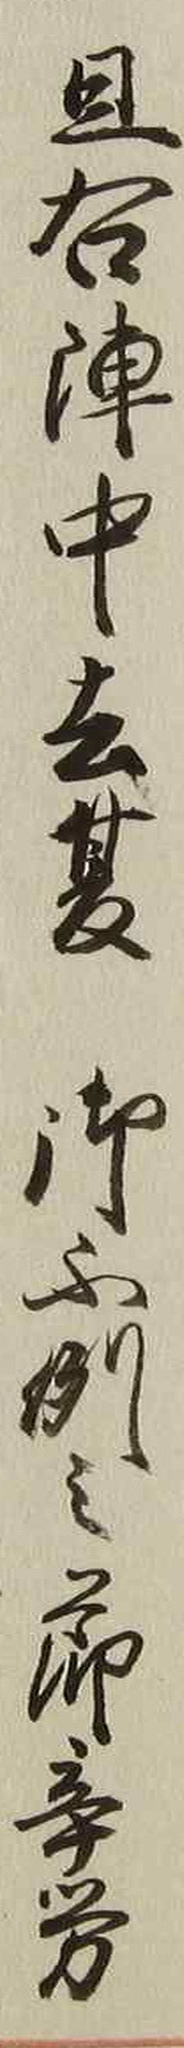且右陣中去夏御不例之節辛労
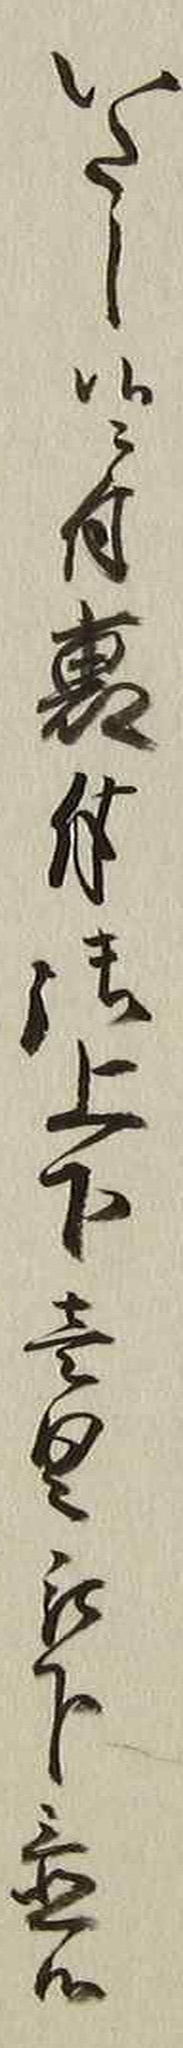いたし候ニ付裏付御上下壱具被下置候
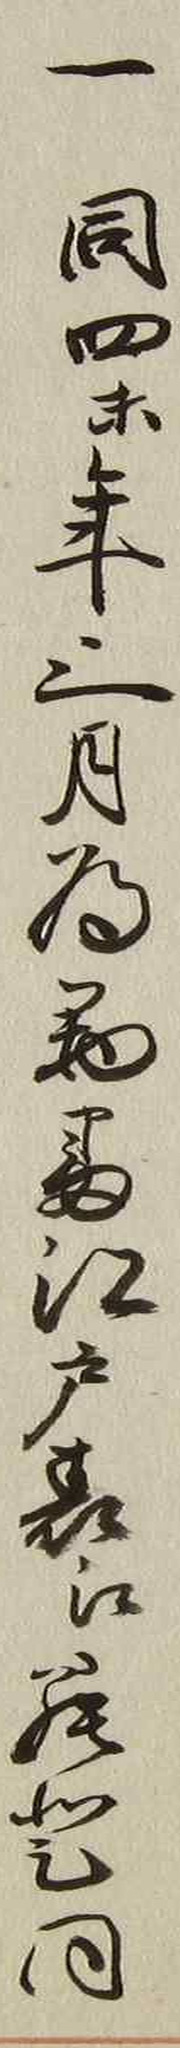一同四未年三月為勤番江戸表江罷登同
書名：諸士系譜　巻之15　い之部15
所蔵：会津若松市立会津図書館
